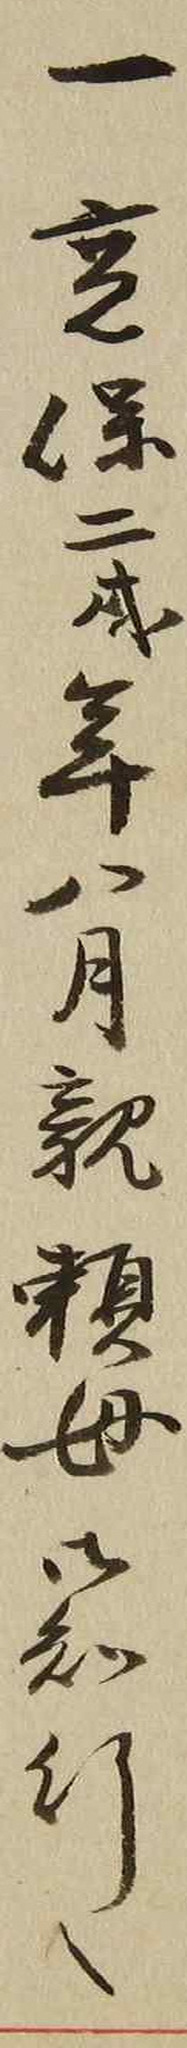一寛保二戌年八月親賴母御知行之
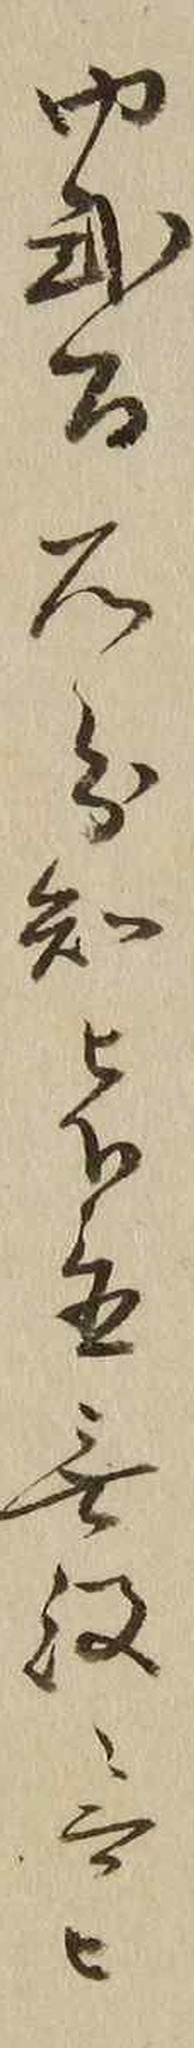内弐百石分知被下置無役に而被
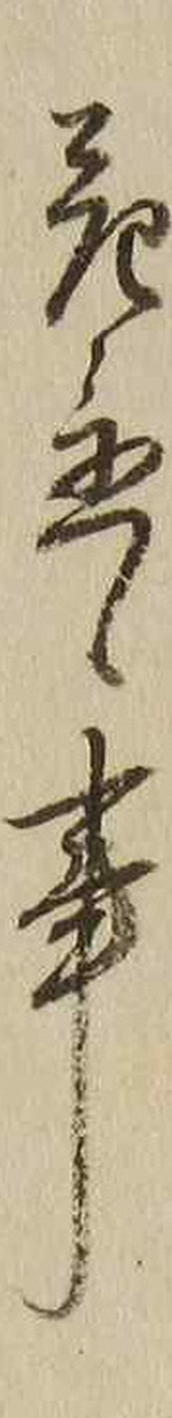差置候事
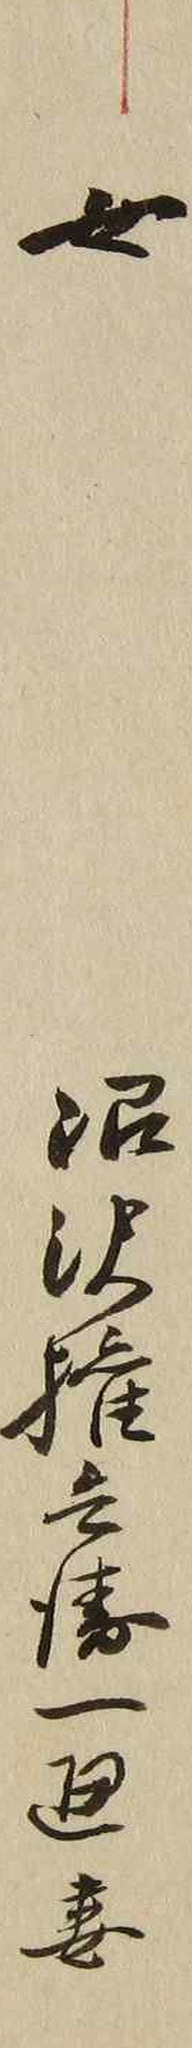女沼沢権兵衛一返妻
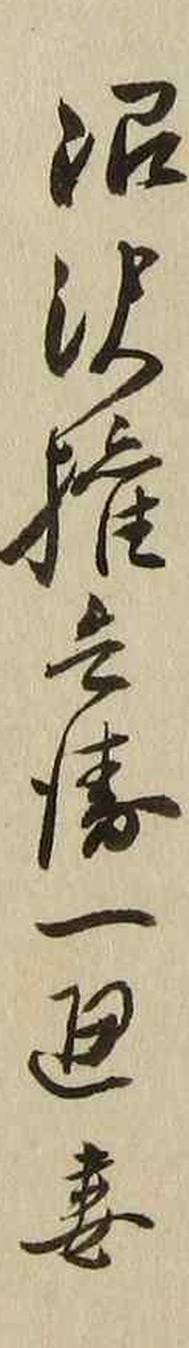女沼沢権兵衛一返妻

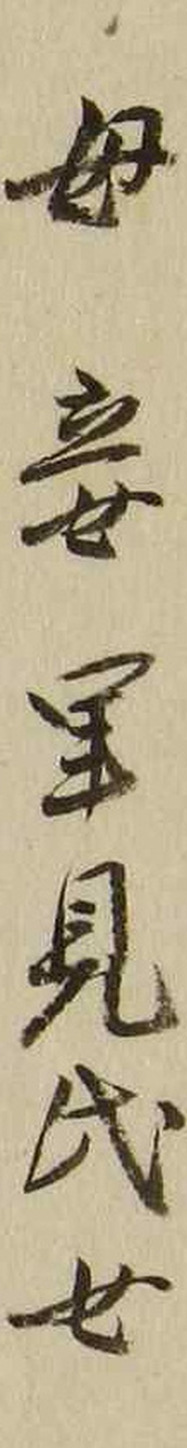母妾里見氏女
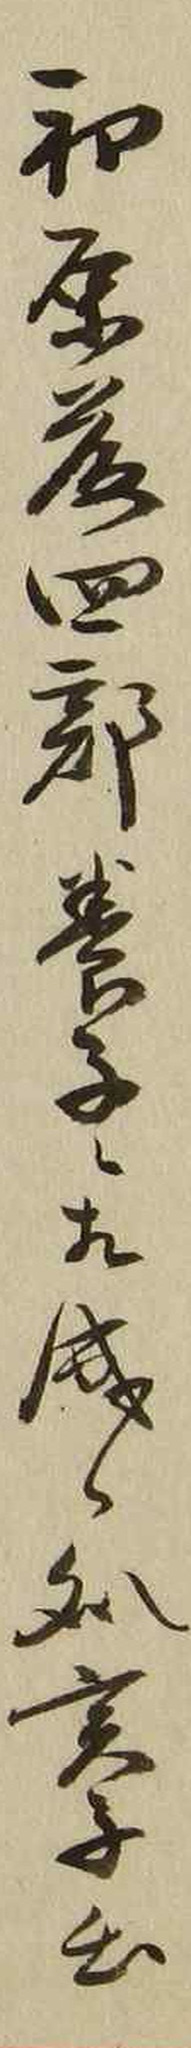初原藤四郎養子に相成候処実子出
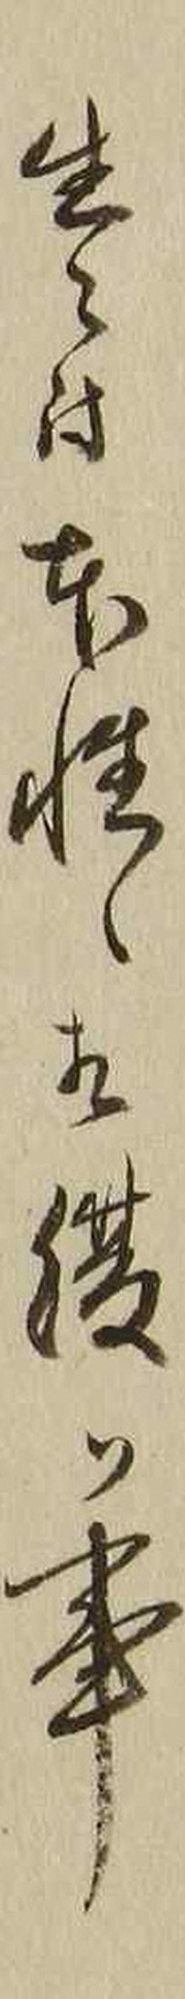生に付本性へ相復候事
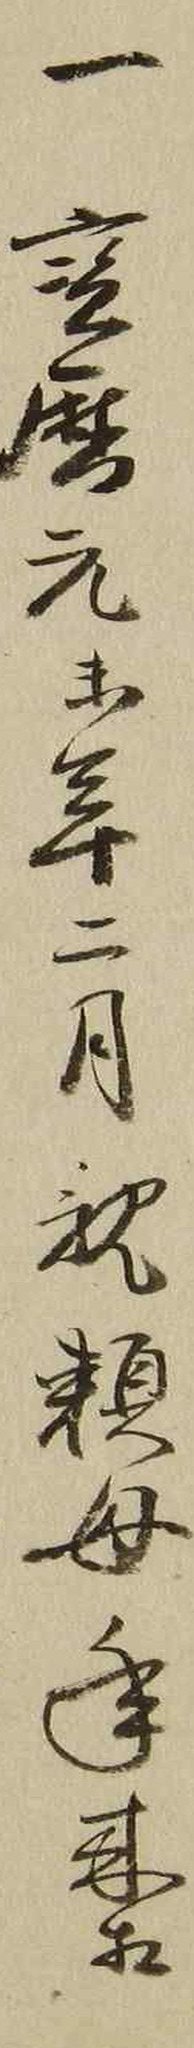一宝暦元未年二月親賴母年来相
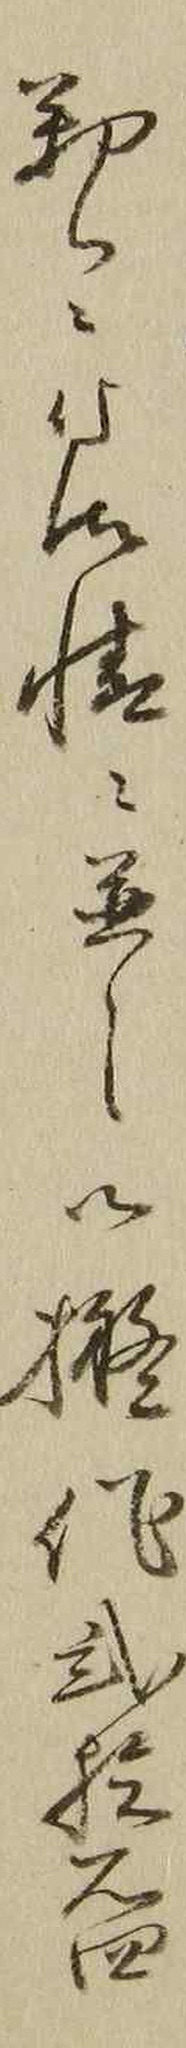勤候に御情に並之御擬作弐拾石四
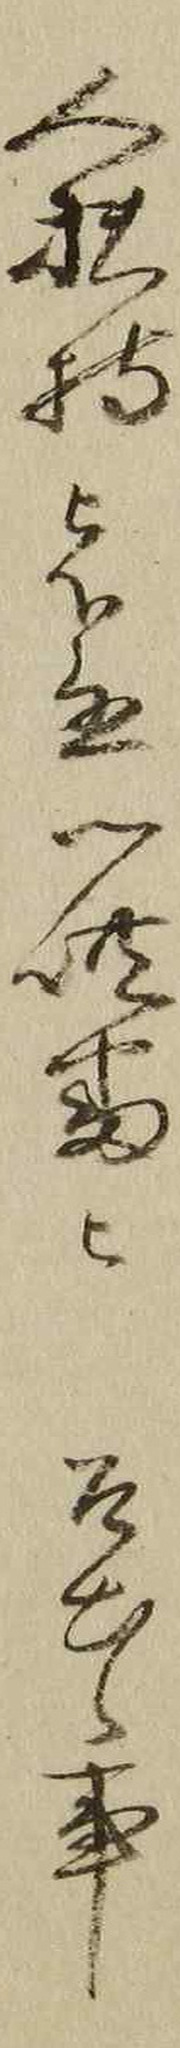人扶持被下置御供番被召出候事
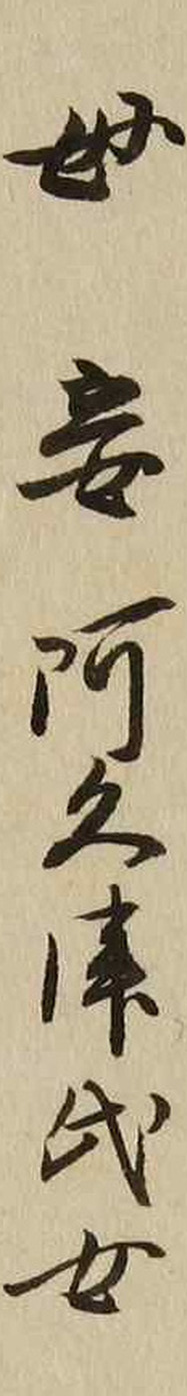母妾阿久津氏女
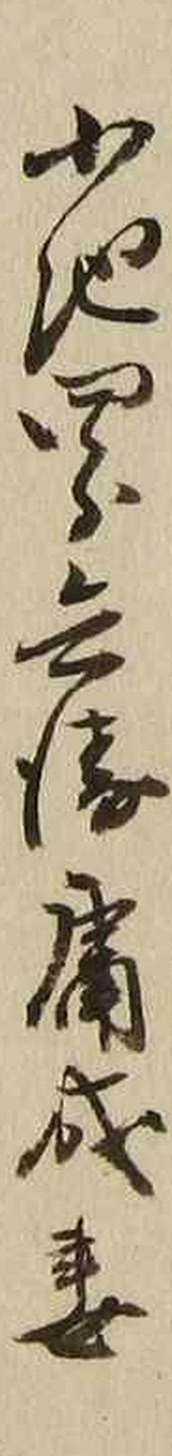小池四郎兵衛庸成妻
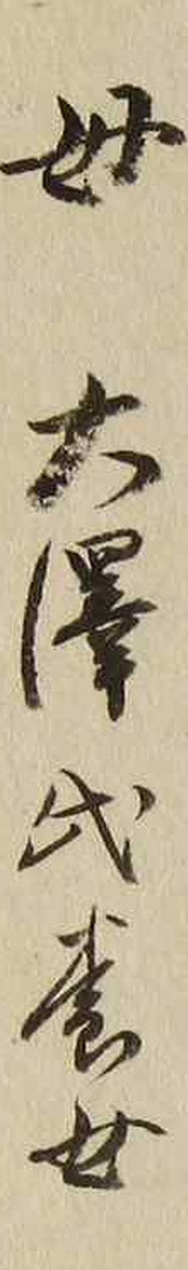母大沢氏養女
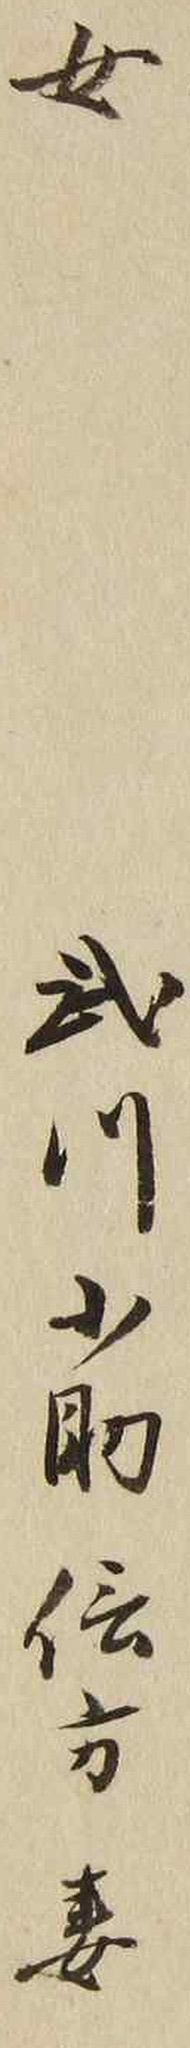女武川小助信方妻
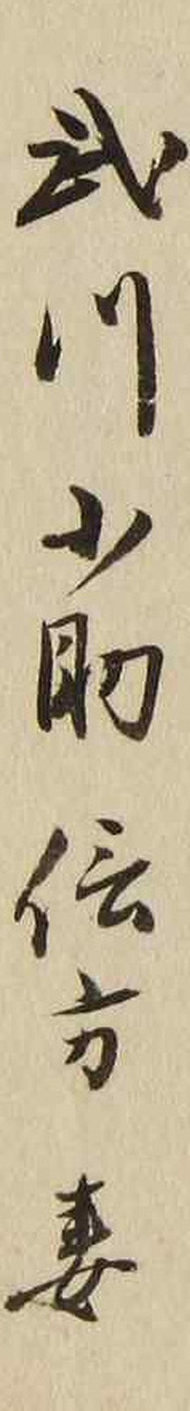女武川小助信方妻
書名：諸士系譜　巻之269　さ之部1
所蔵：会津若松市立会津図書館
